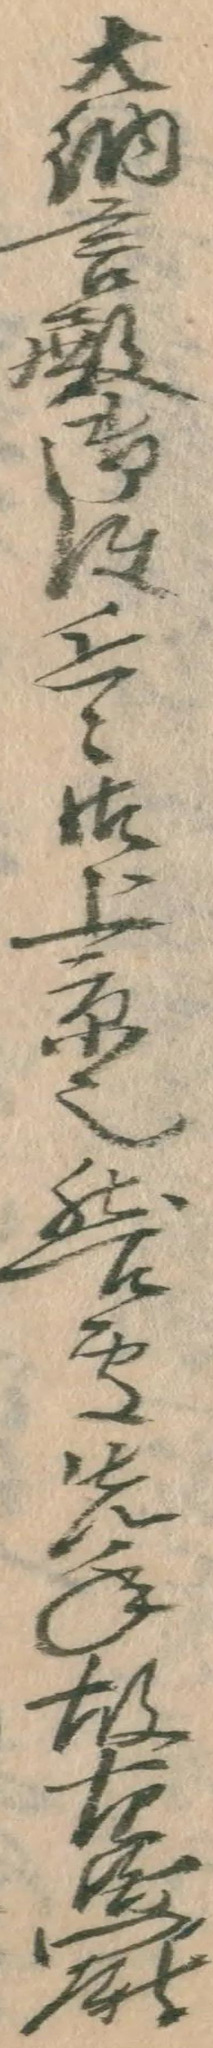大納言殿御使近〻御上京也然ル處先年故左近尉
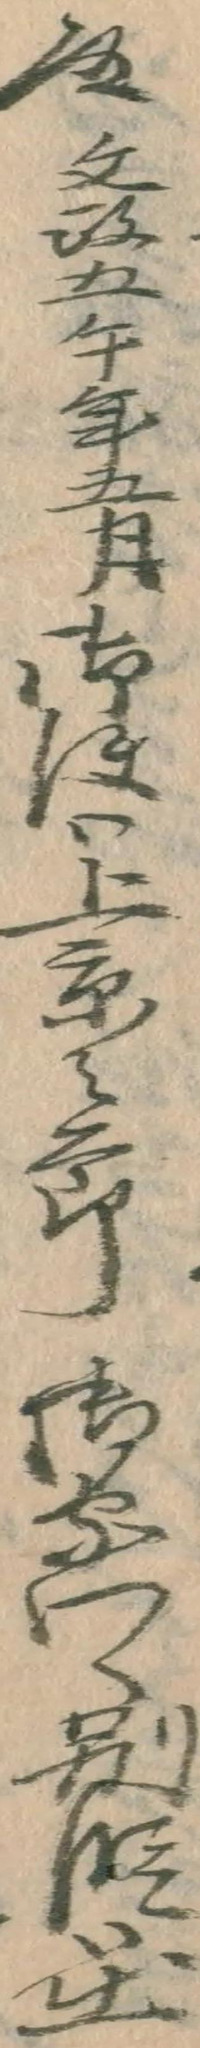殿文政五午年五月御使御上京之節御家門へ寐段御出

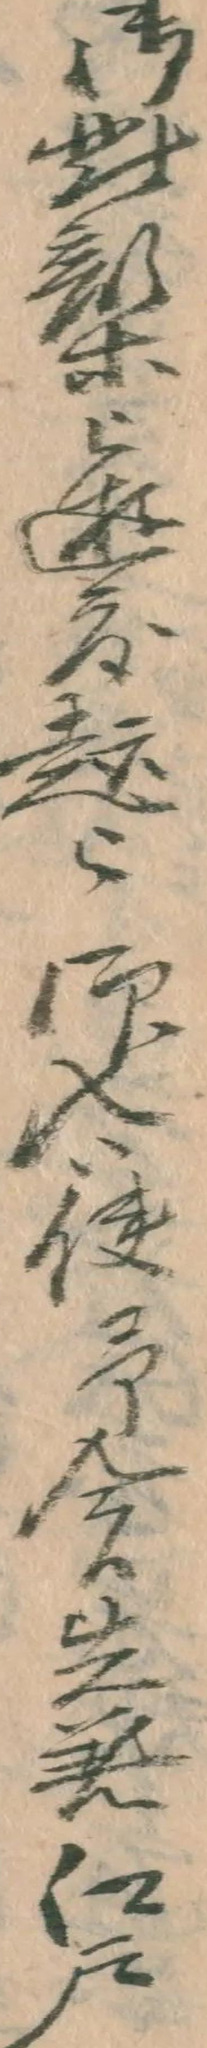御對顔等被遊度趣被仰入ハ使予今日先着江戸
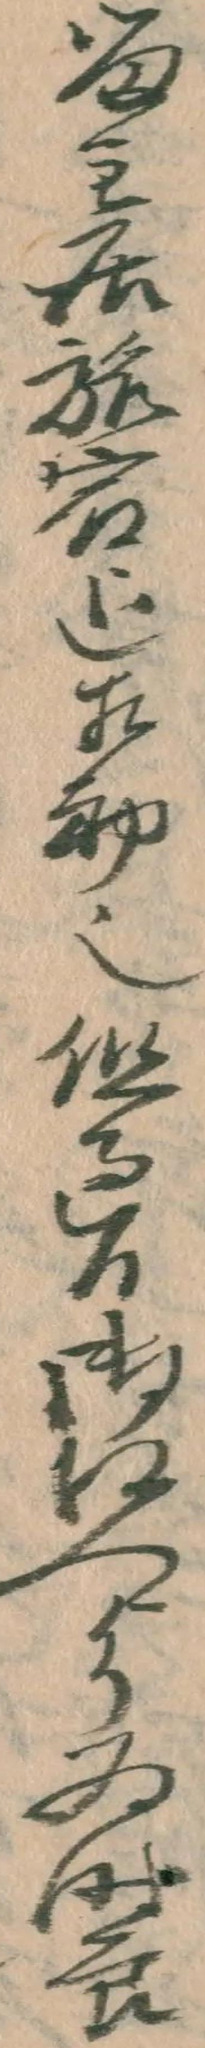留主居旅宿迄相勤也但過日御四人より為時節
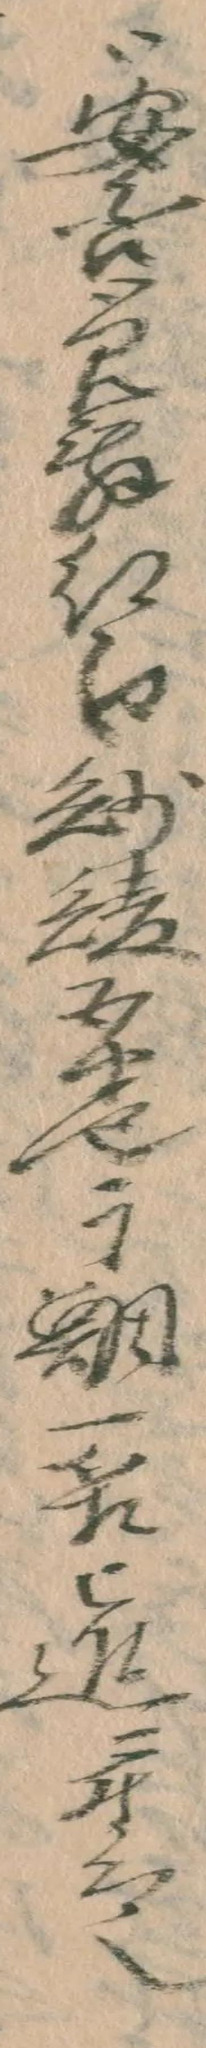御安否御見舞紅白紗綾五巻干鯛一箱被進ニ付而也
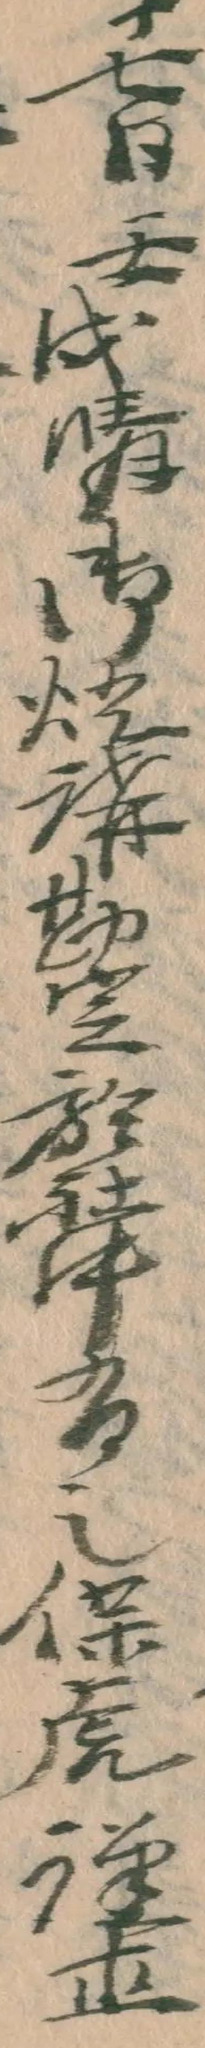十七日壬戌晴御燈講勘定於社中有之保虎謹直
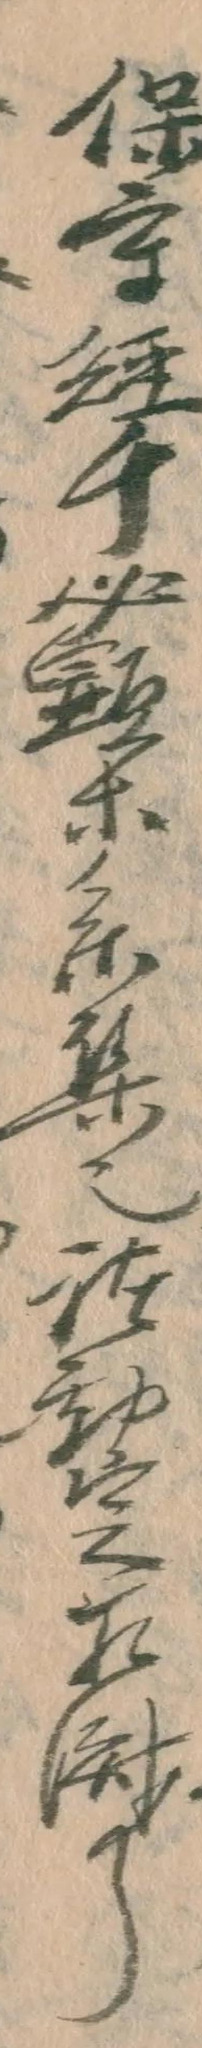保守経千必顕等参集也諸勧定相済了
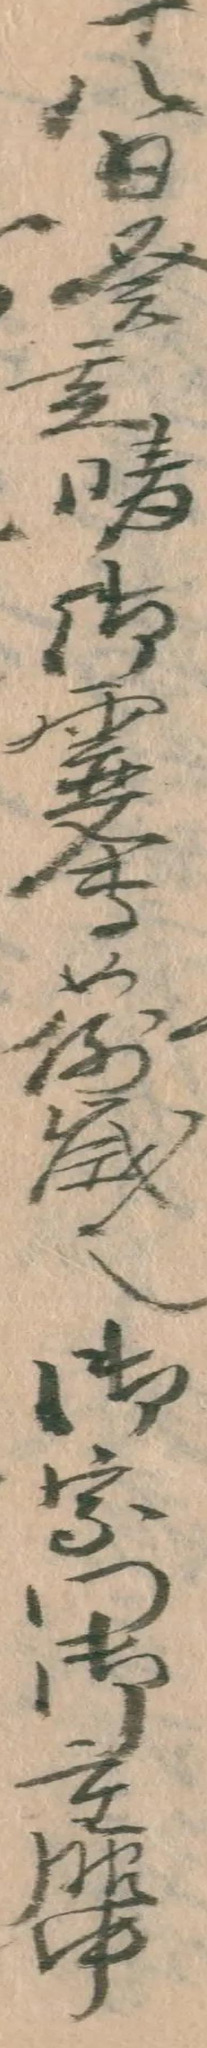十八日癸亥晴御霊會如例歳也御家門御重服中
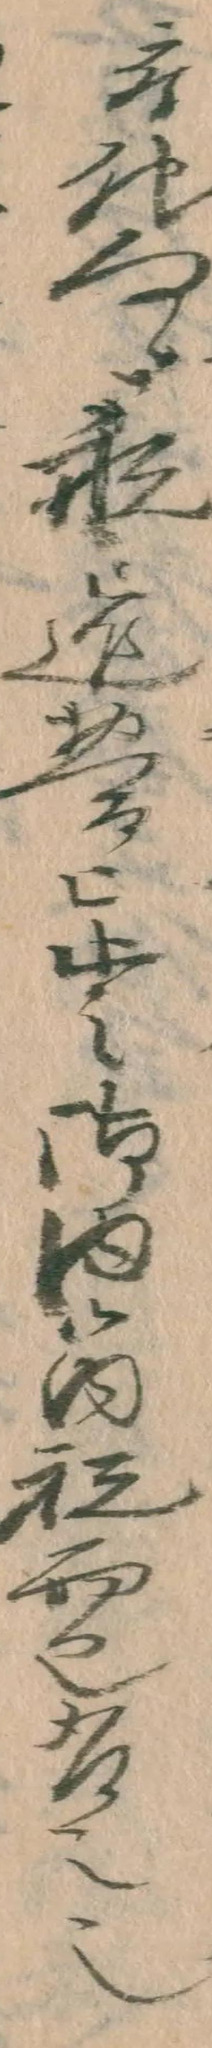ニ付代向候祝被達惣而被止之御内御内祝而巳有之也
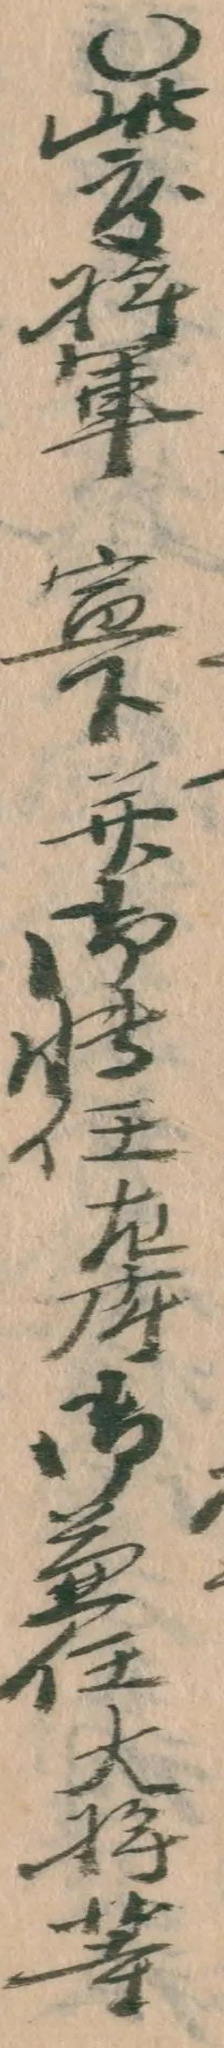○此度将軍宣下幷御轉任左府御兼任大将等
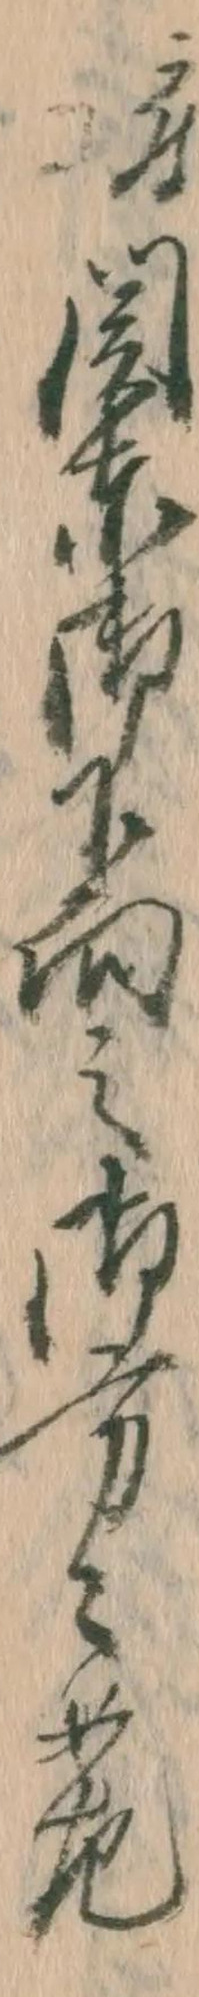ニ付関東御下向之御方々如左
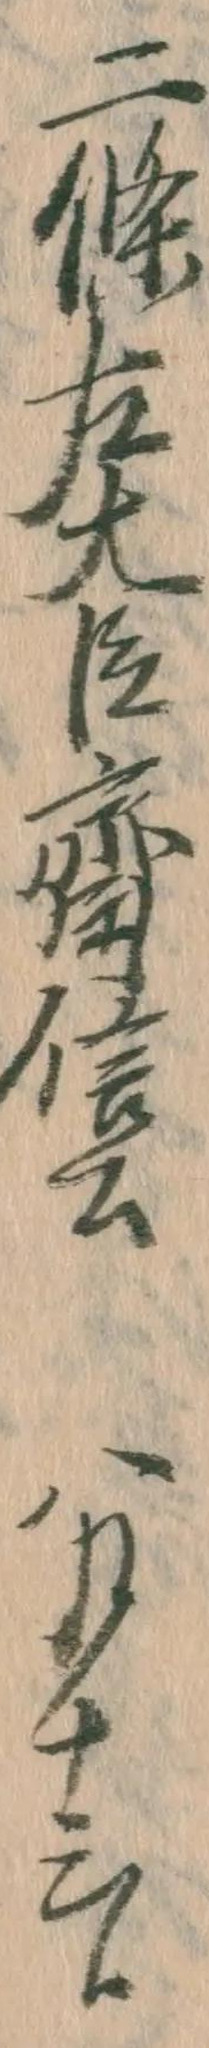二條左大臣齋信公八月十三日
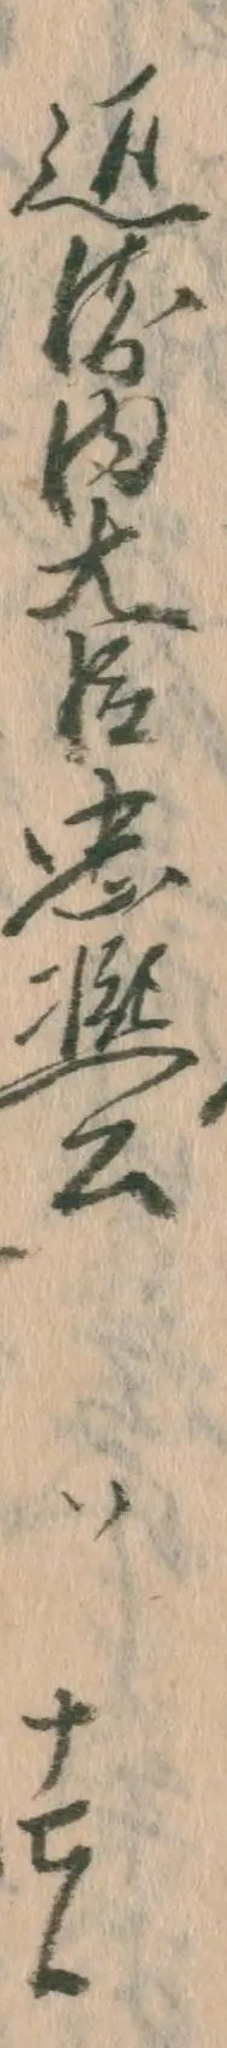近衛内大臣忠熙公同十四日
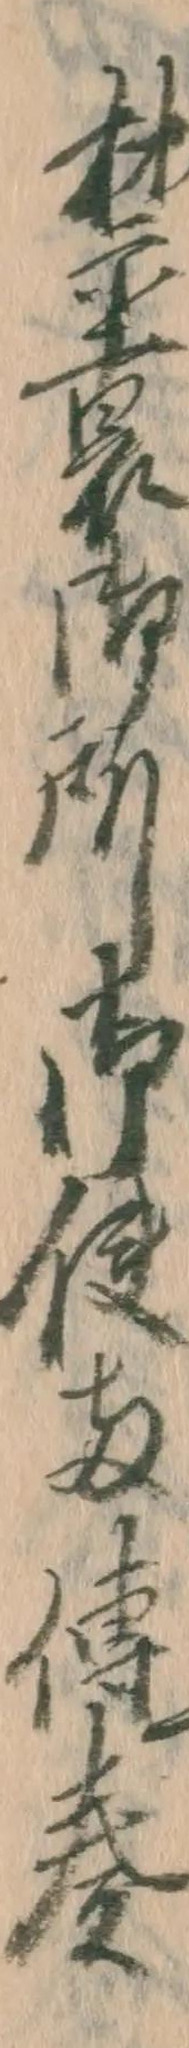禁裏御所御使両傳奏
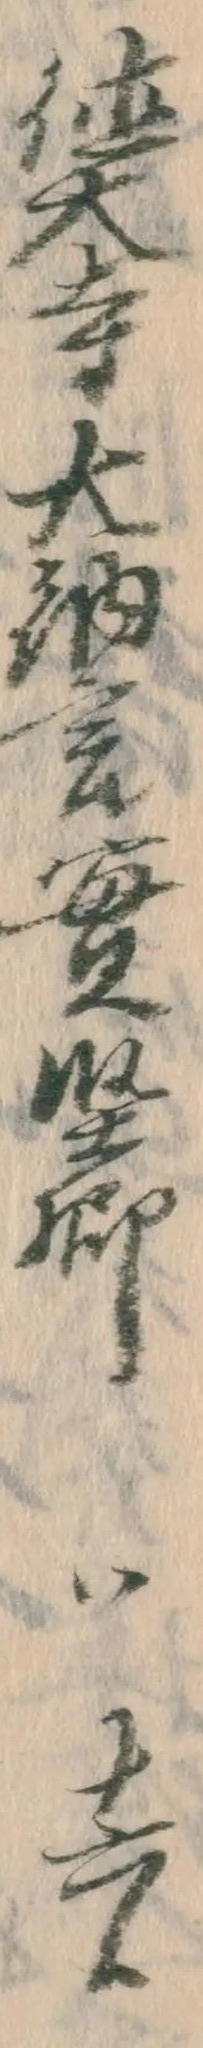徳大寺大納言實堅卿同十六日
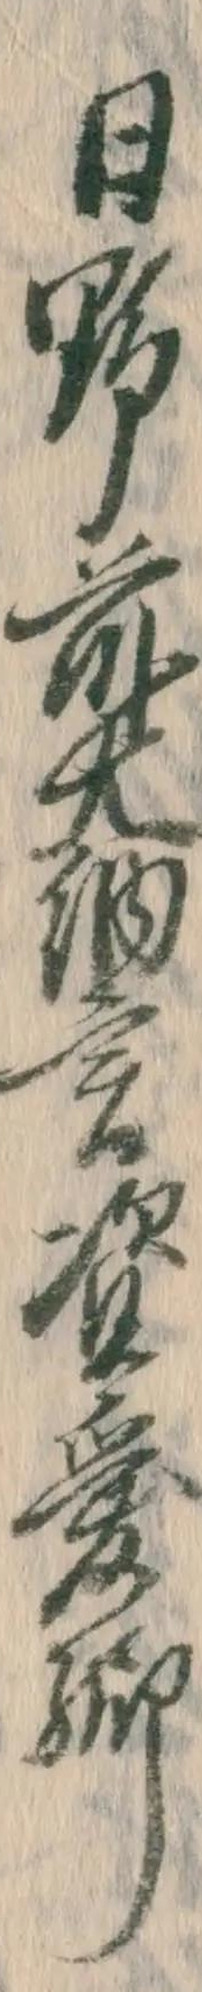日野前大納言資愛卿同
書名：賀茂社記録. 第67冊
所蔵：国立国会図書館 National Diet Library, JAPAN
